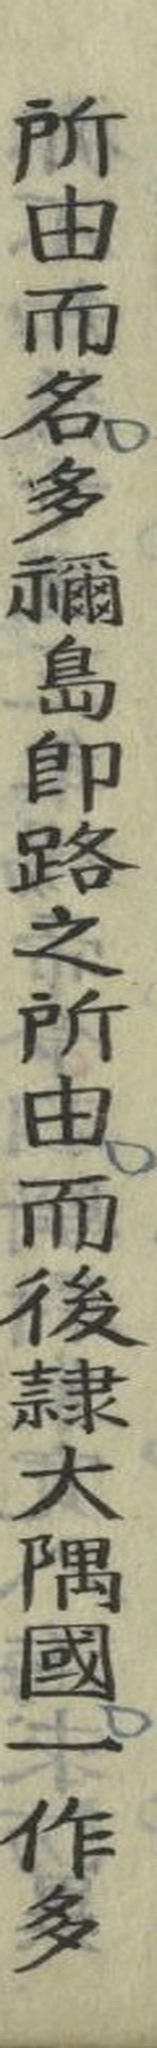所由而名。多禰島卽路之所由。而後隷大隅國。一作多
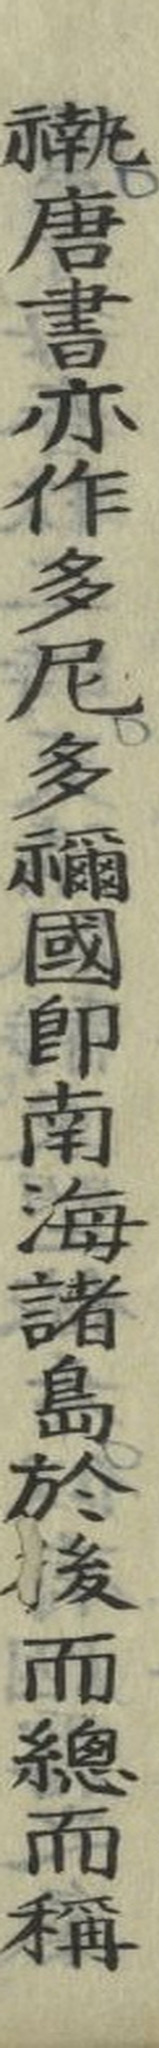褹。唐書亦作多尼。多禰國卽南海諸島。於後而總而稱
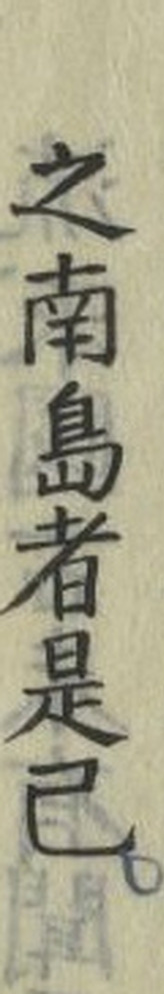之南島者是已。
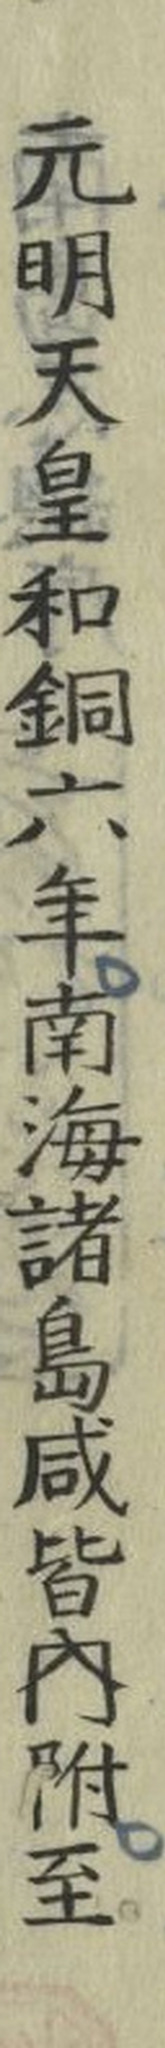元明天皇和銅六年。南海諸島咸皆内附。至
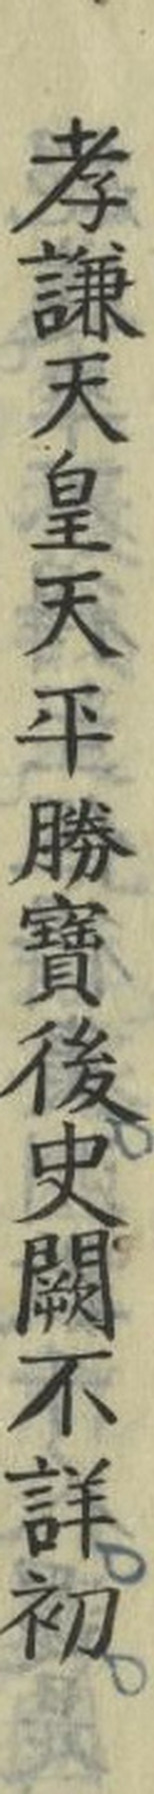孝謙天皇天平勝寶後。史闕不詳。初。
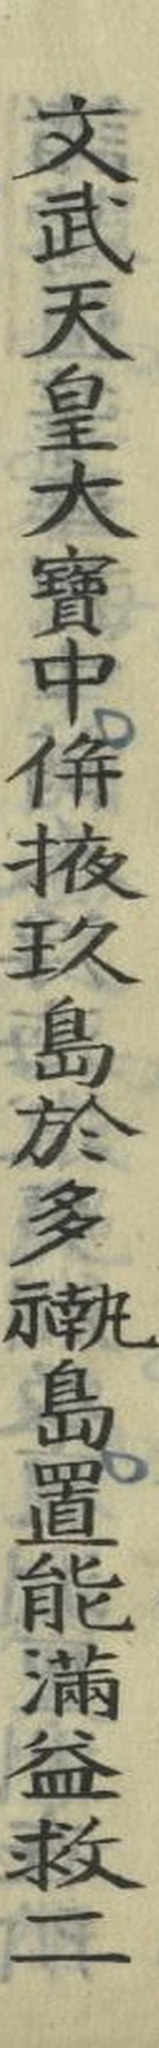文武天皇大寶中。併掖玖島於多褹島。置能滿益救二
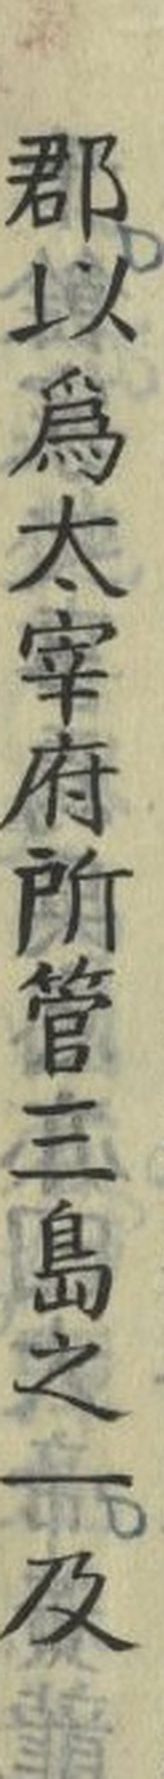郡。以爲太宰府所管三島之一。及
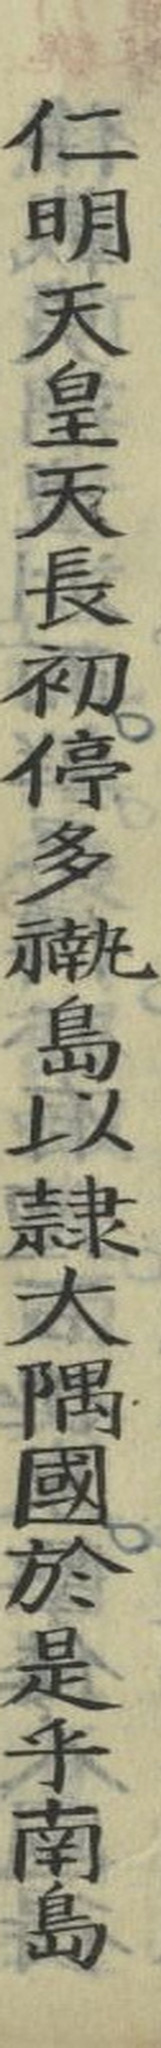仁明天皇天長初。停多褹島以隷大隅國。於是乎南島
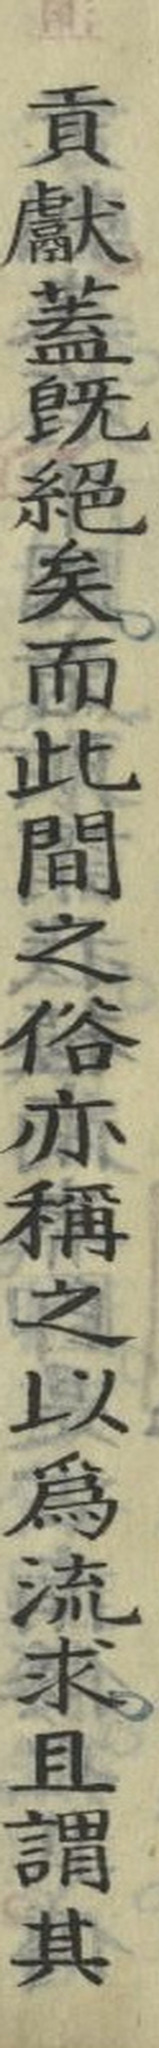貢獻蓋既絕矣。而此間之俗亦稱之以爲流求。且謂其
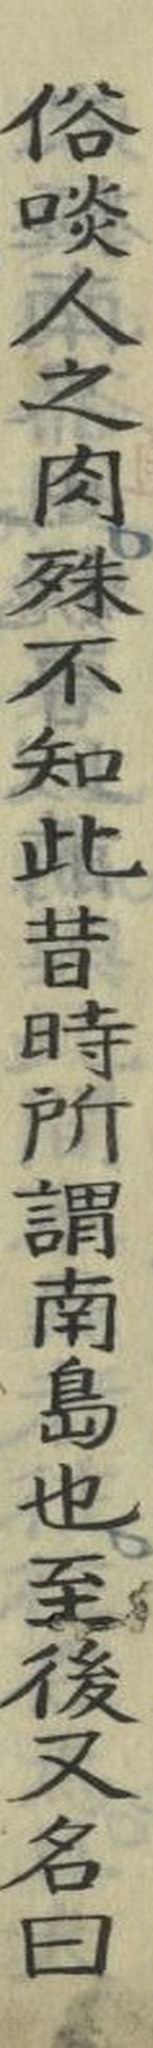俗啖人之肉。殊不知此昔時所謂南島也。至後又名曰
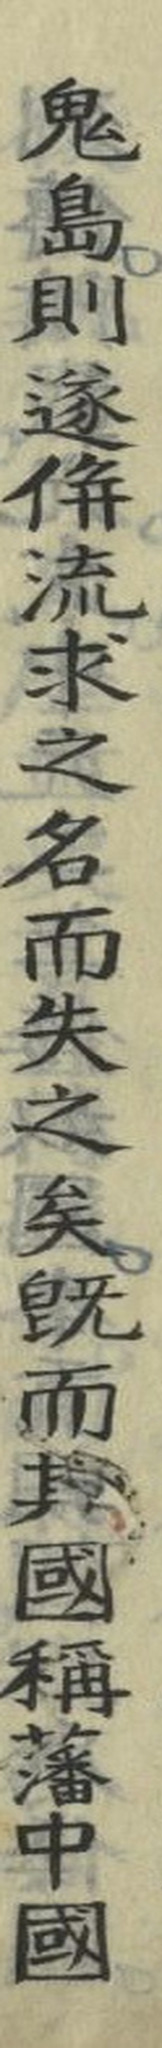鬼島。則遂併流求之名而失之矣。既而其國稱藩中國
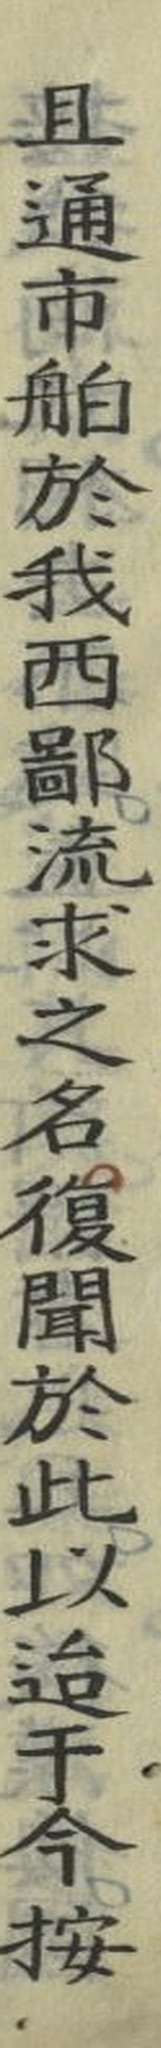且通市舶於我西鄙。流求之名。復聞於此。以迨于今。按
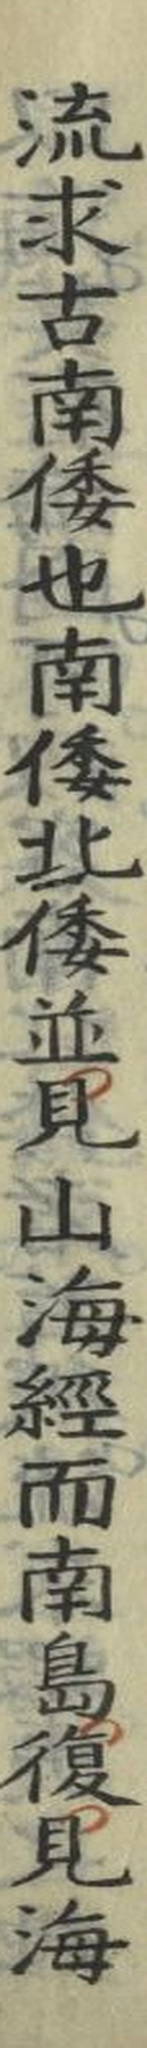流求古南倭也。南倭北倭並見山海經。而南島復見海
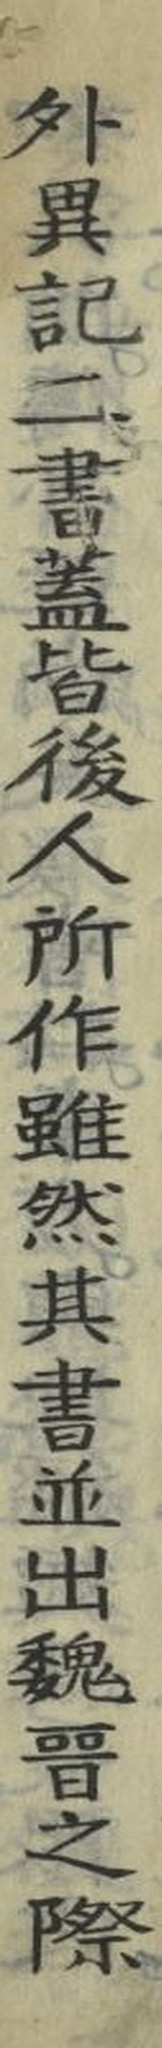外異記。二書蓋皆後人所作。雖然。其書並出魏晉之際

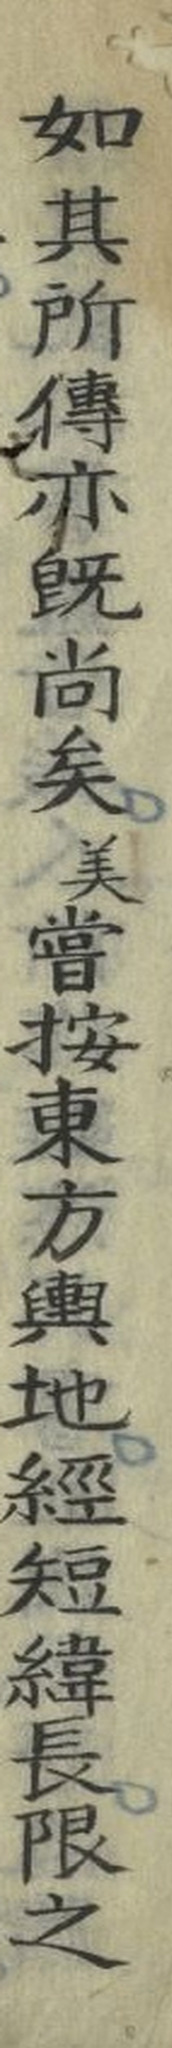如其所傳亦既尚矣。美嘗按東方輿地。經短緯長。限之
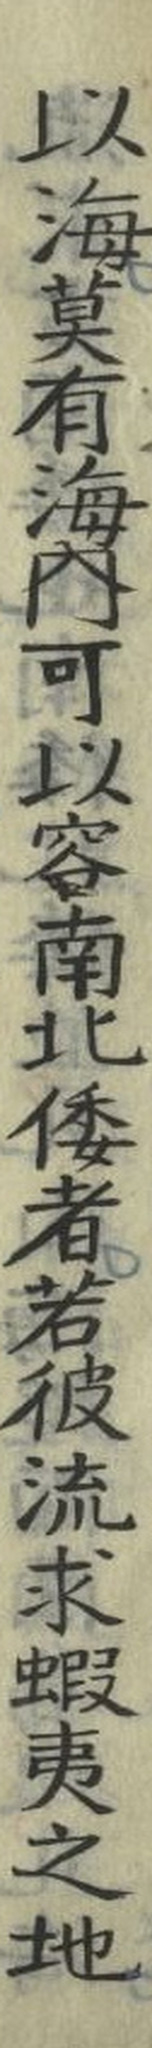以海。莫有海内可以容南北倭者。若彼流求蝦夷之地。
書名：南島志
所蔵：University of the Ryukyus Library
